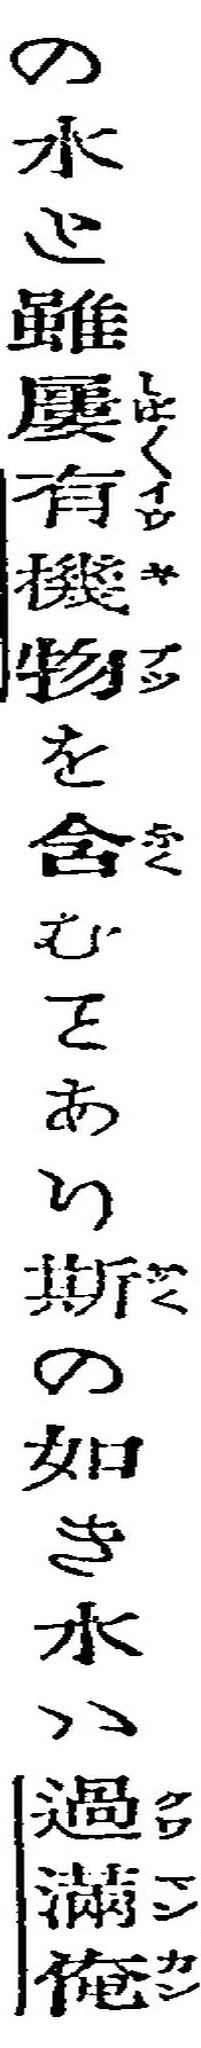の水と雖屡有機物を含むことあり斯の如き水は過滿俺
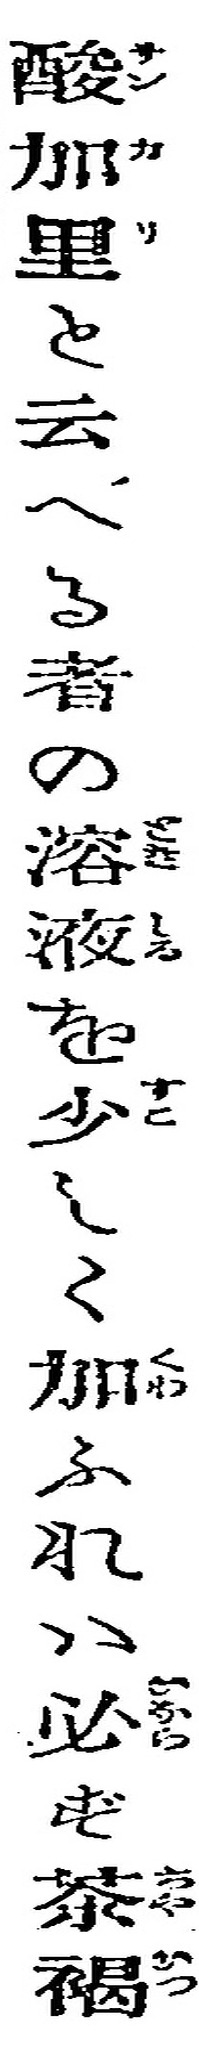酸加里と云へる者の溶液を少しく加ふれは必ず茶褐
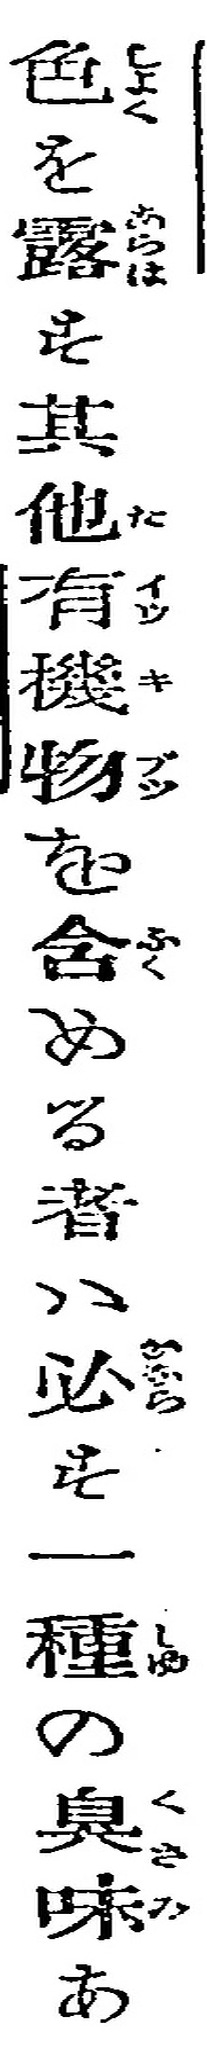色を露す其他有機物を含める者は必す一種の臭味あ
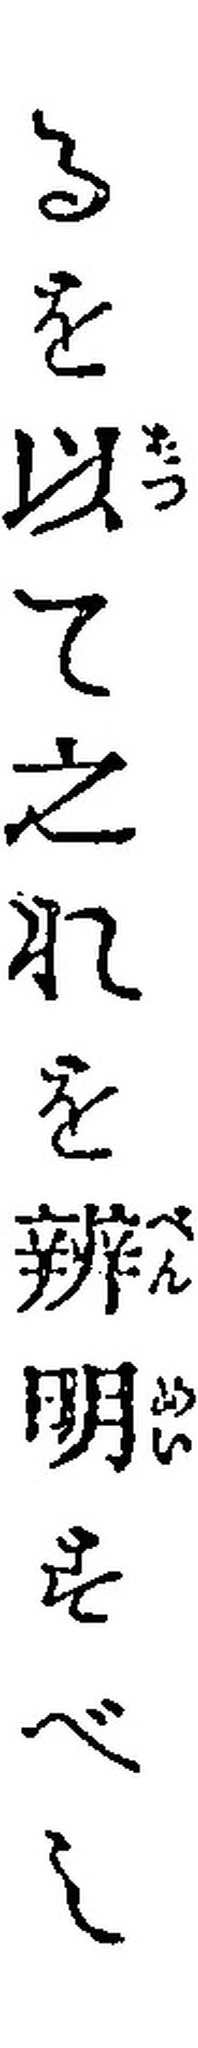るを以て之を辨明すべし
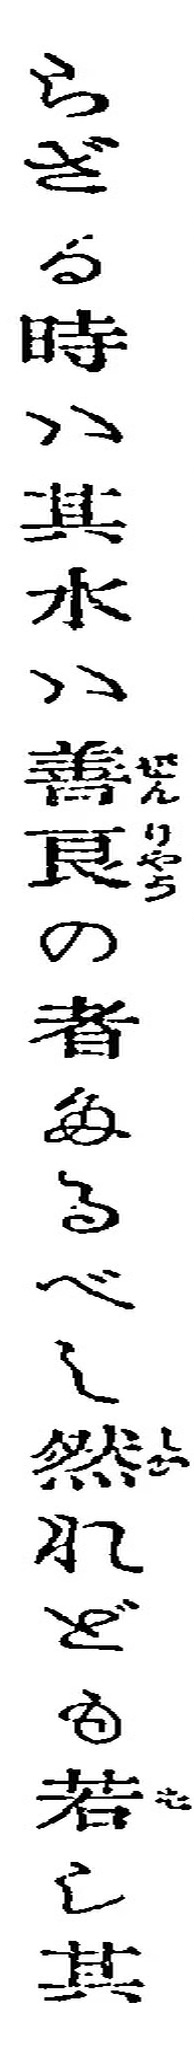らざる時は其水は善良の者たるべし然れども若し其
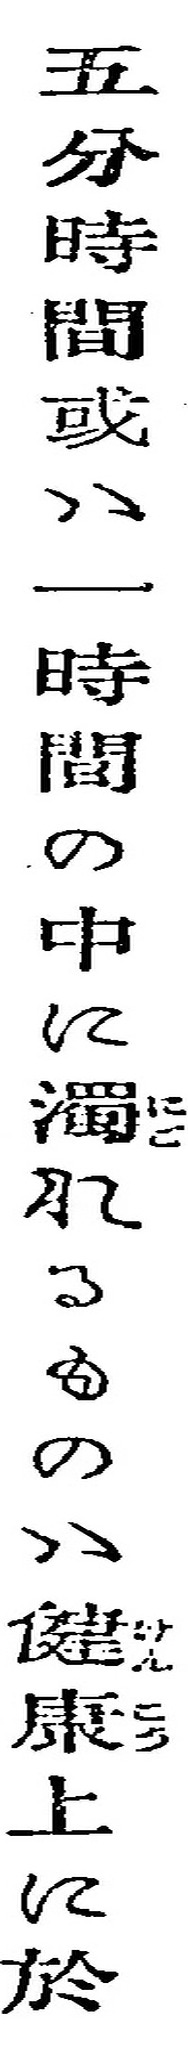五分時間或は一時間の中に濁れるものは健康上に於
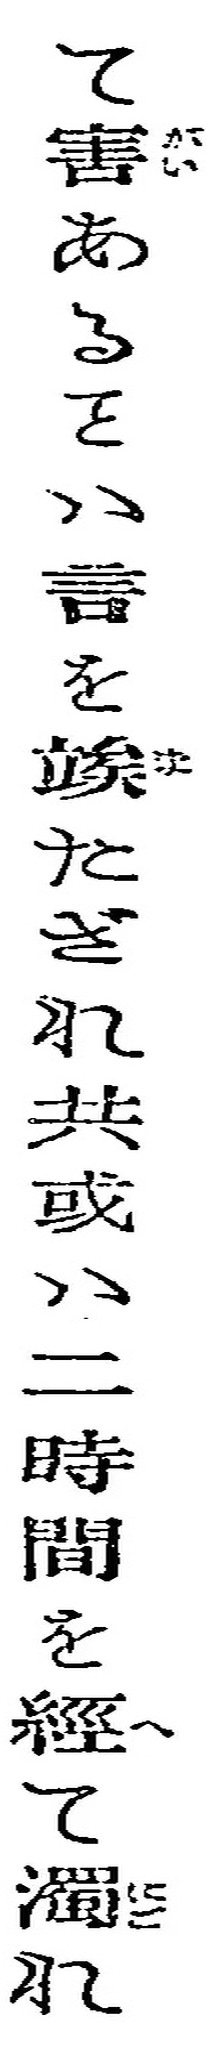て害あることは言を竢たざれ共或は二時間を経て濁れ
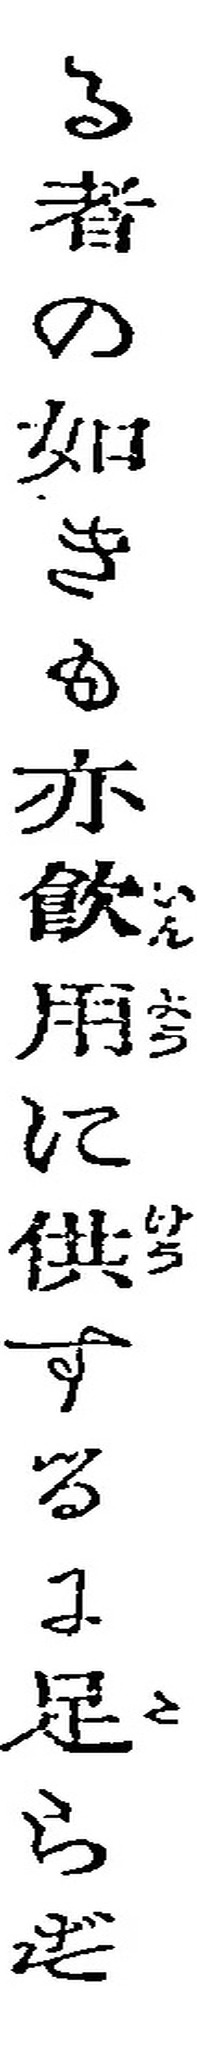る者の如きも亦飲用に供するに足らず
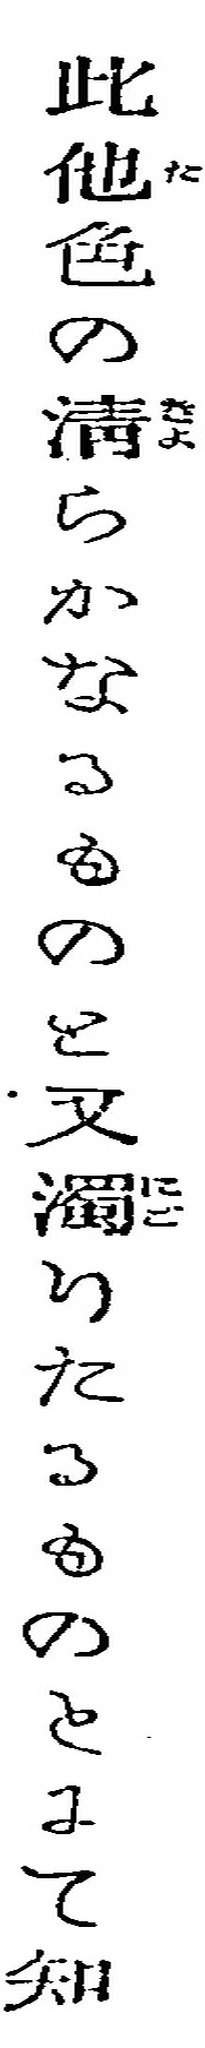此他色の清らかなるものと又濁りたるものとにて知
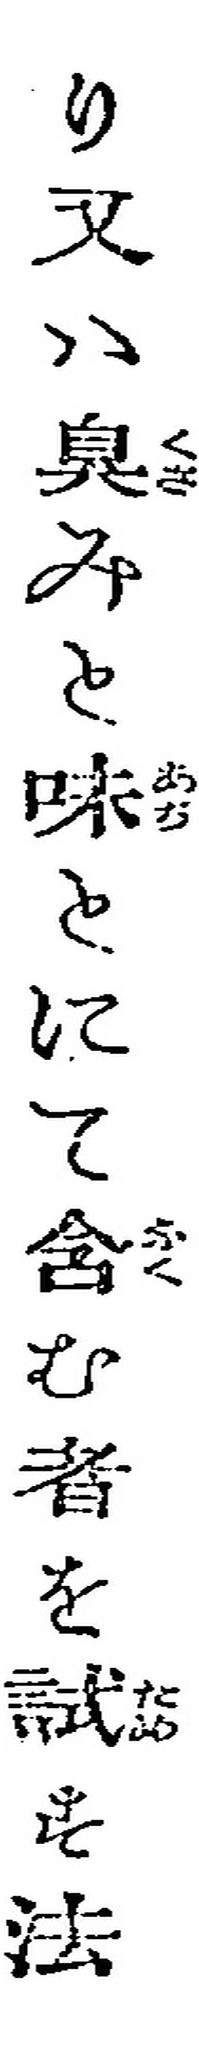り又は臭みと味とにて含む者を試す法
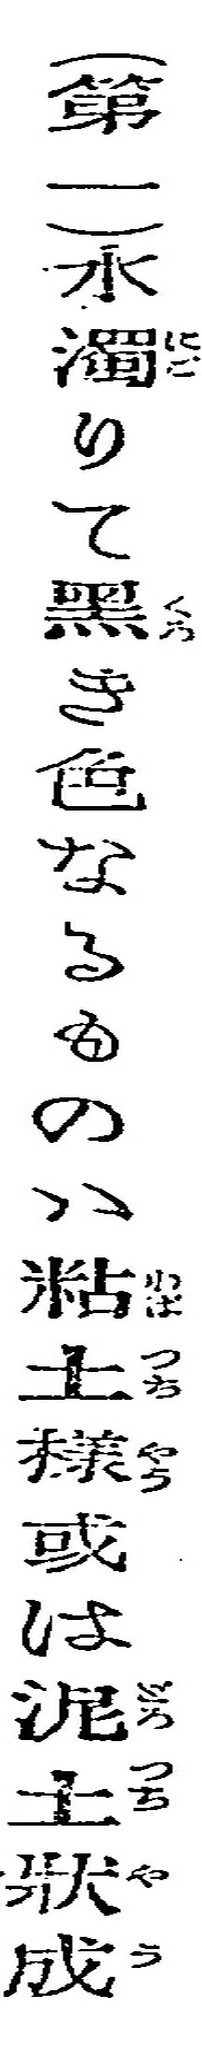[第一]水濁にて黒き色なるものは粘土様或は泥土状成
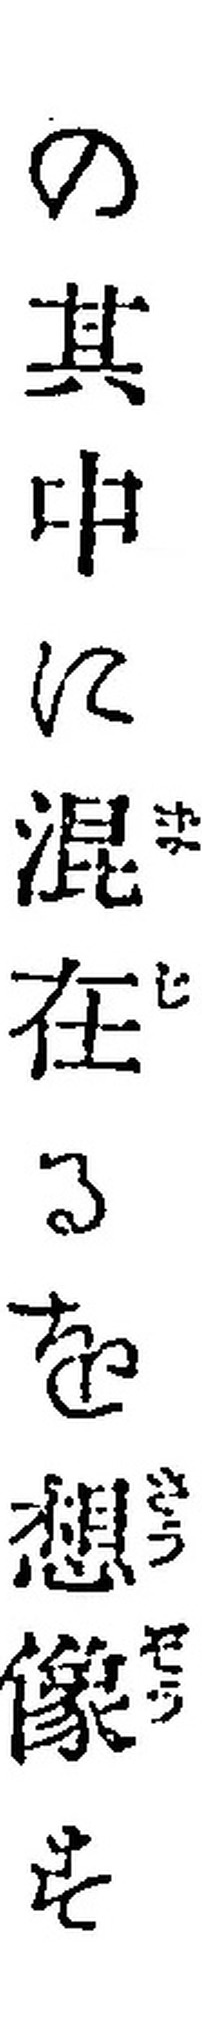の其中に混在るを想像す
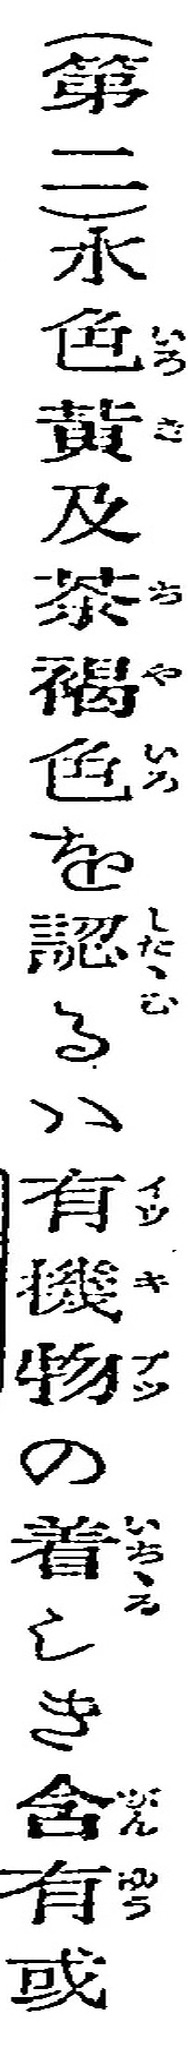[第二]水色黄及褐色を認るは有機物の着しき含有或
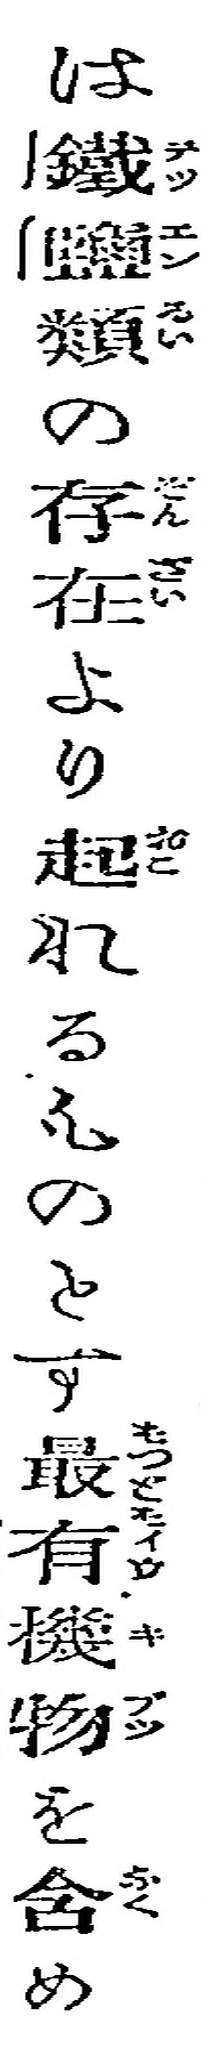は鐵、鹽類の存在より起れるものとす最有機物を含め
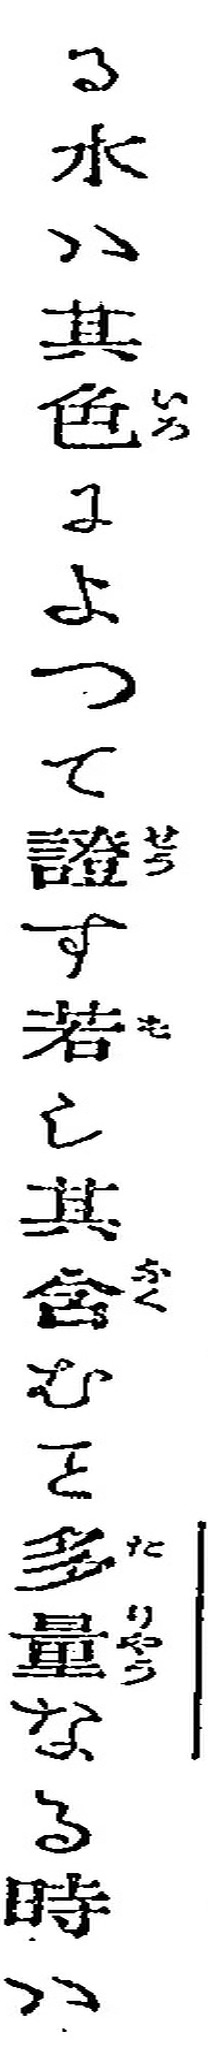る水は其色によつて證す若し其含むこと多量なる時は

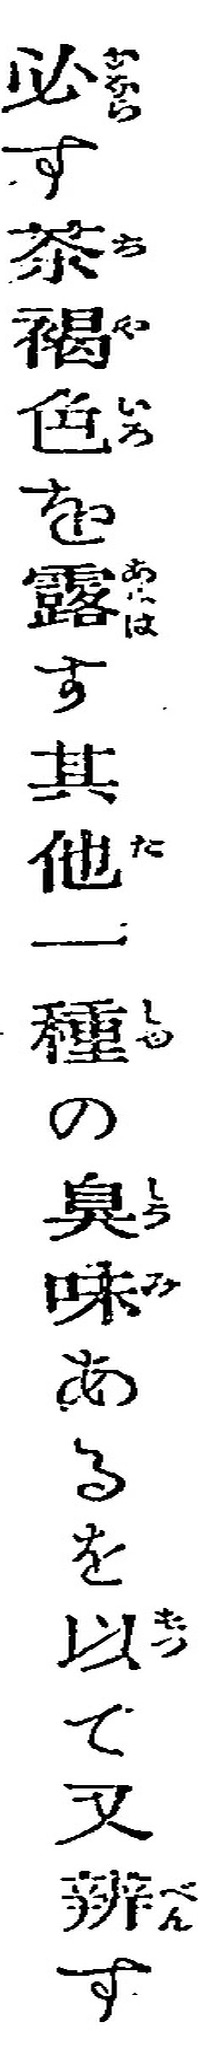必す茶褐色を露す其他一種の臭味あるを以て又辨す
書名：飲水の心得 : 伝染病の予防
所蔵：国立国会図書館 National Diet Library, JAPAN
